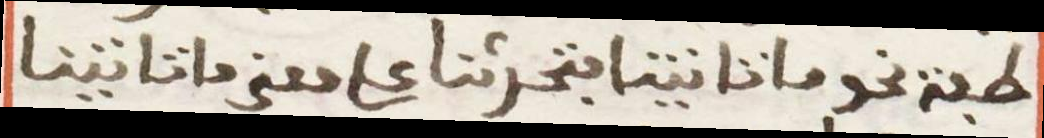طفة نحو ما تاتينا فتحرثنا على معنى ما تاتينا
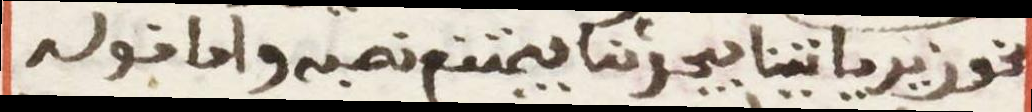نحو زيد ياتينا فيحرثنا فيمتنع نصبه واما قوله
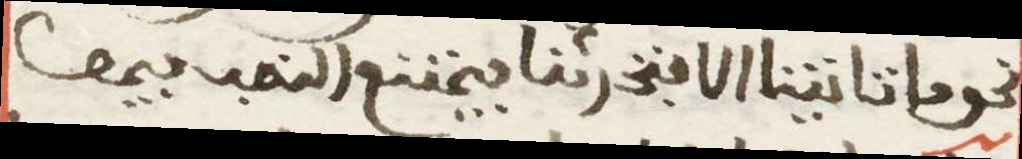نحو ما تاتينا الا فتحرثنا فيمتنع النصب فيها
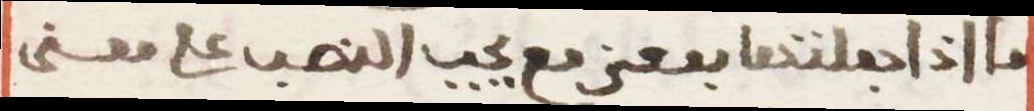ما اذا جعلتها بمعنى مع يجب النصب على معنى
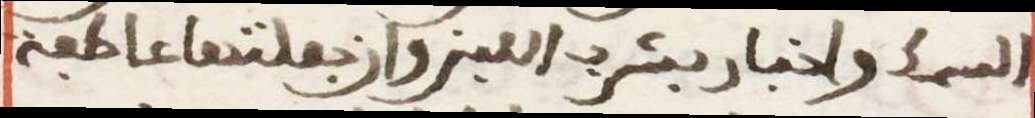السمك واخبار بشرب اللبن وان جعلتها عاطفة
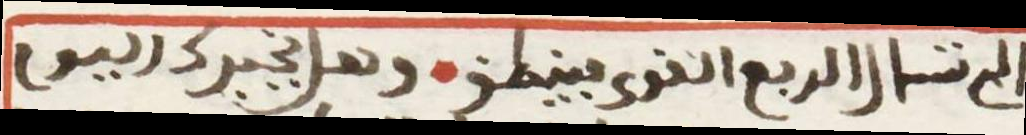الم تسال الرفع القوى فينطبق وهل نجيرك اليوم
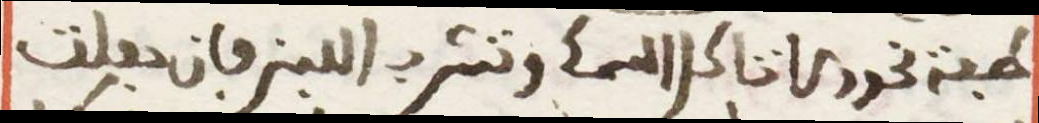طفة نحو ولا تاكل السمك وتشرب اللبن فان جعلت
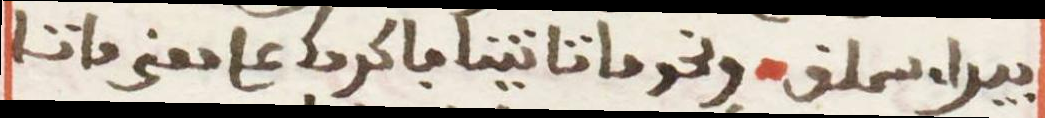بيداء سملق ونحو ما تاتينا فاكرمك على معنى ما تا
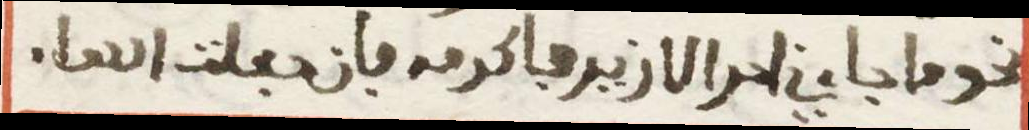نحو ما جاءني احد الا زيد فاكرمه فان جعلت الهاء
